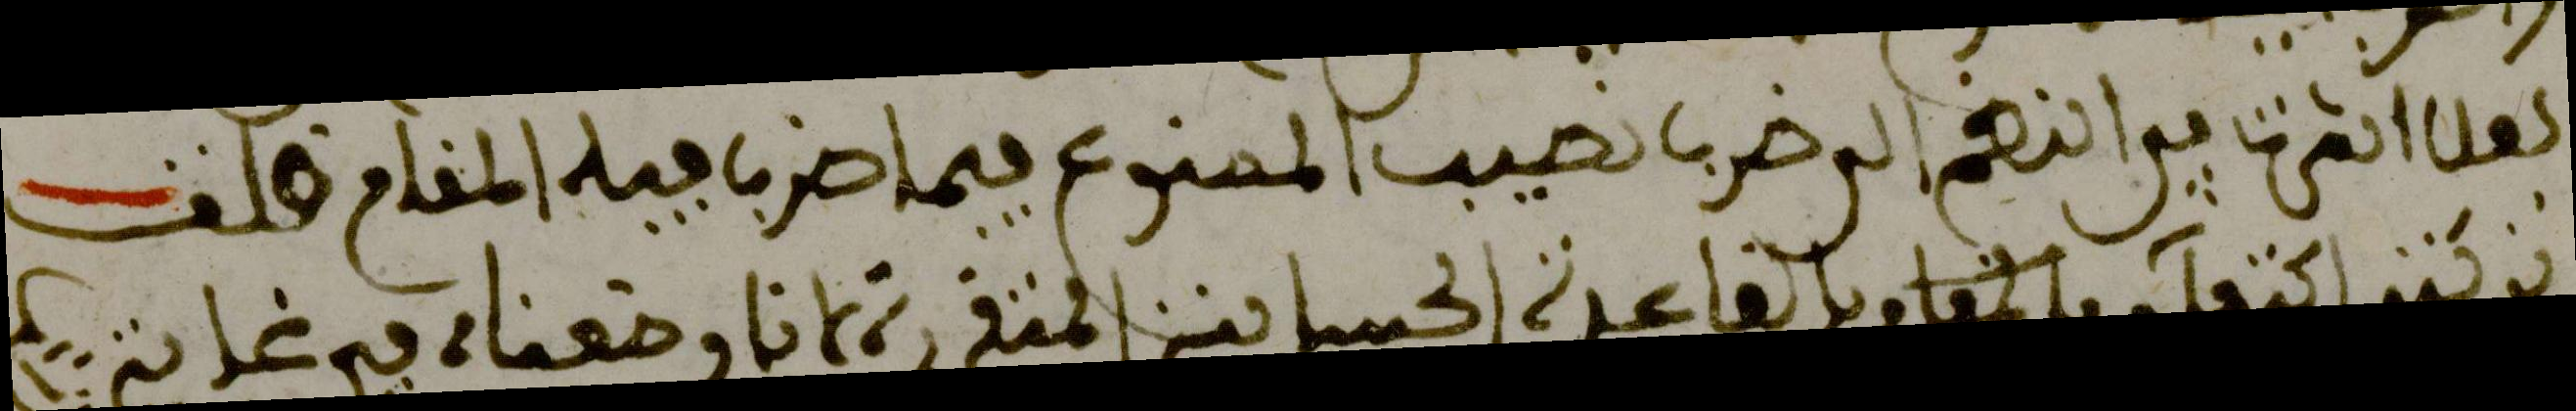هلا اشرت في النظم الى ضرب نصيب الممنوع فيما ضرب فيه المقام قلت
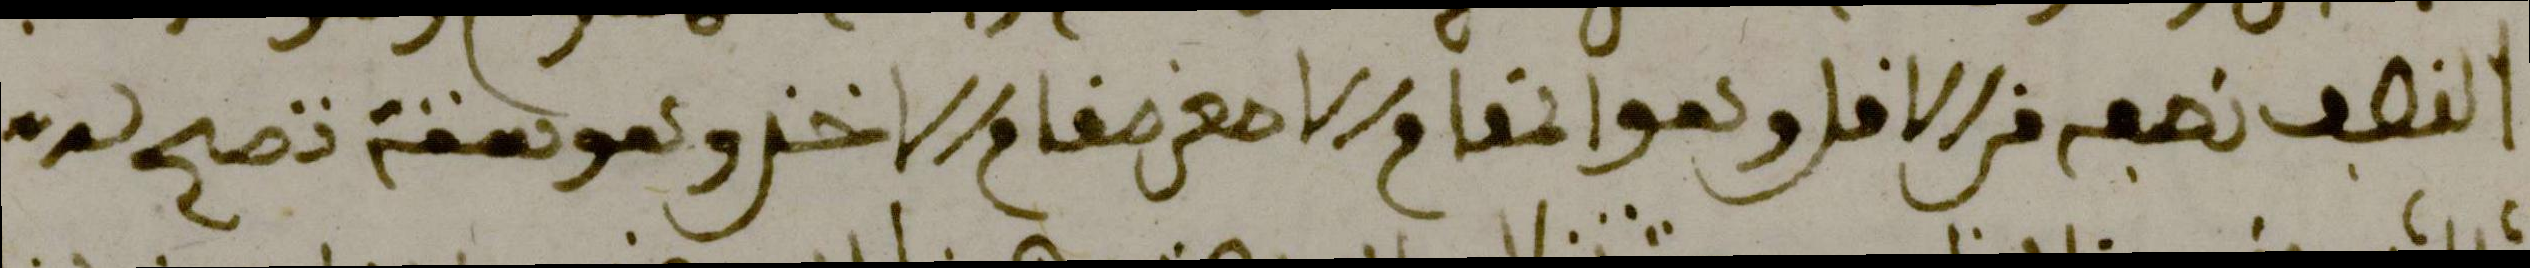النصف نصفه من الاقل وهو المقام الاصغر مقام الاخذ وهو ستة تصح له
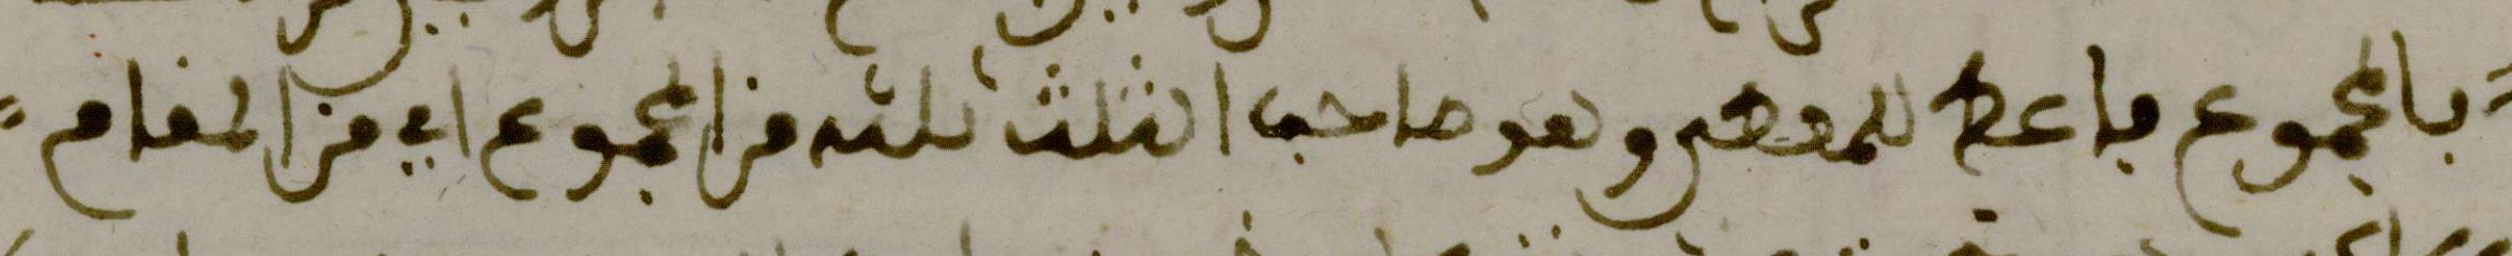بالمجموع فاعط للمعطى وهو صاحب الثلث ثلثه من المجموع اي من المقام
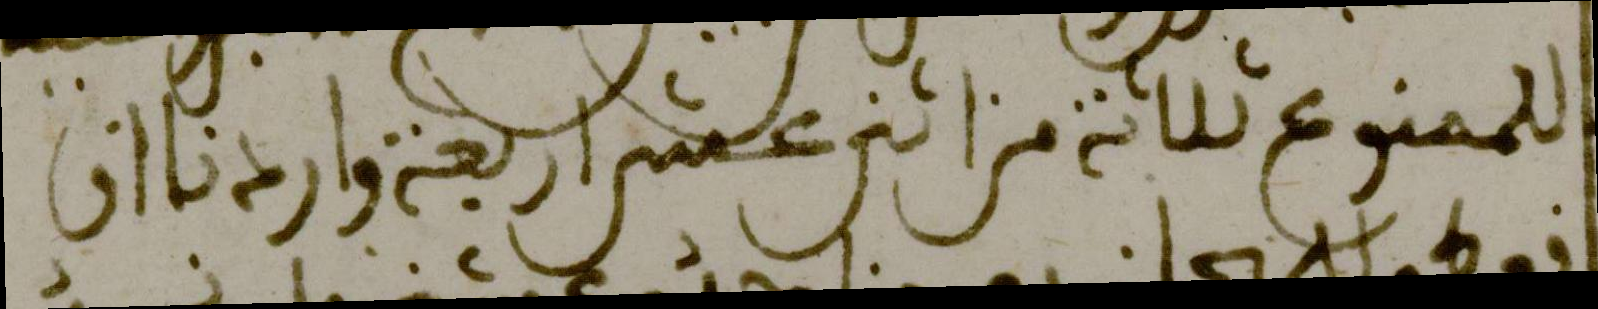للممنوع ثلاث من اثنى عشر اربعة واردنا ان
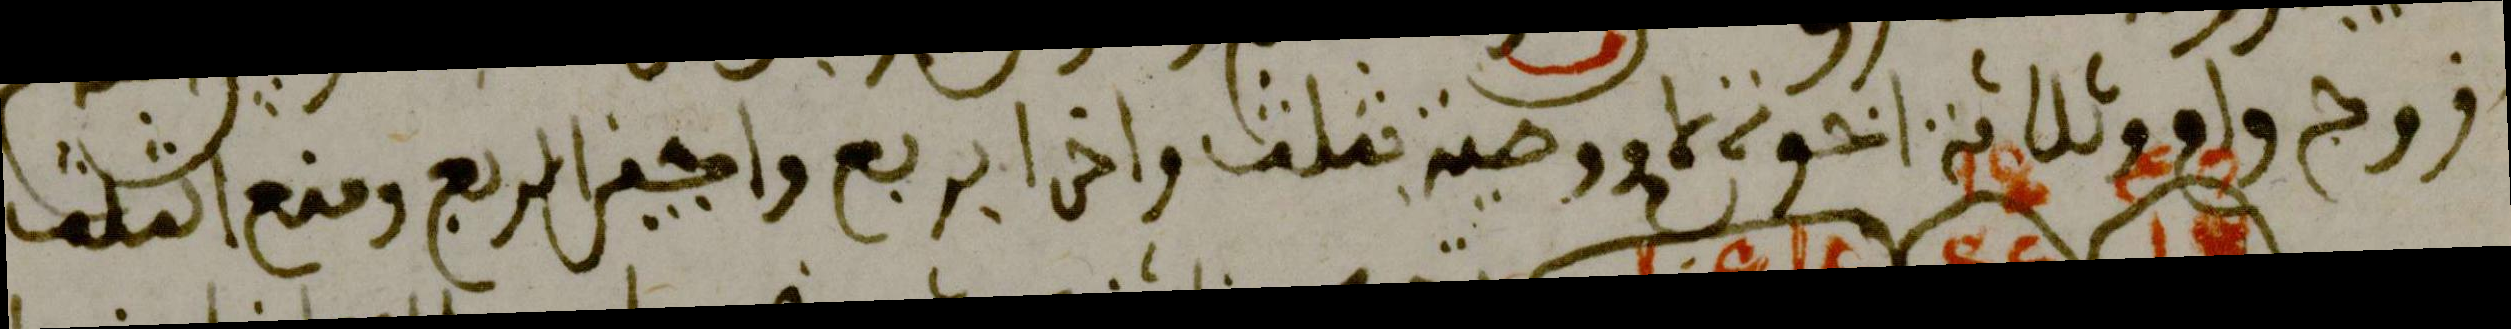زوج وام وثلاثة اخوة لا ووصية بثلث واخرا بربع واجيز الربع ومنع الثلث
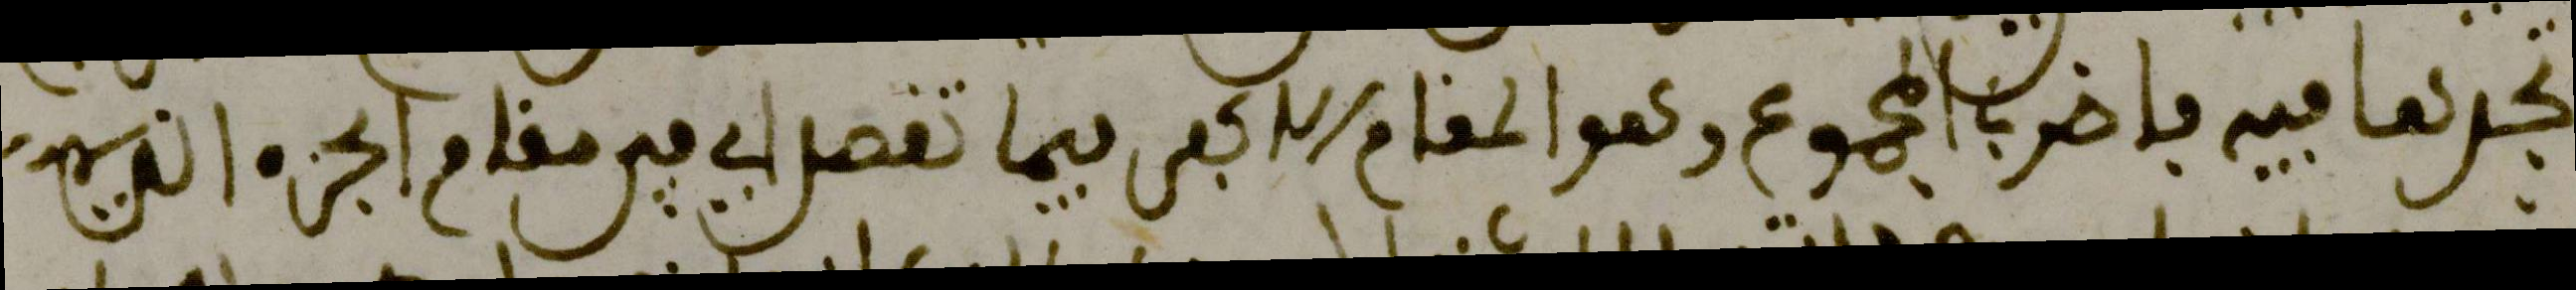تجدها فيه فاضرب المجموع وهو المقام الاكبر فيما تقصد اي في المقام الجزء الذي
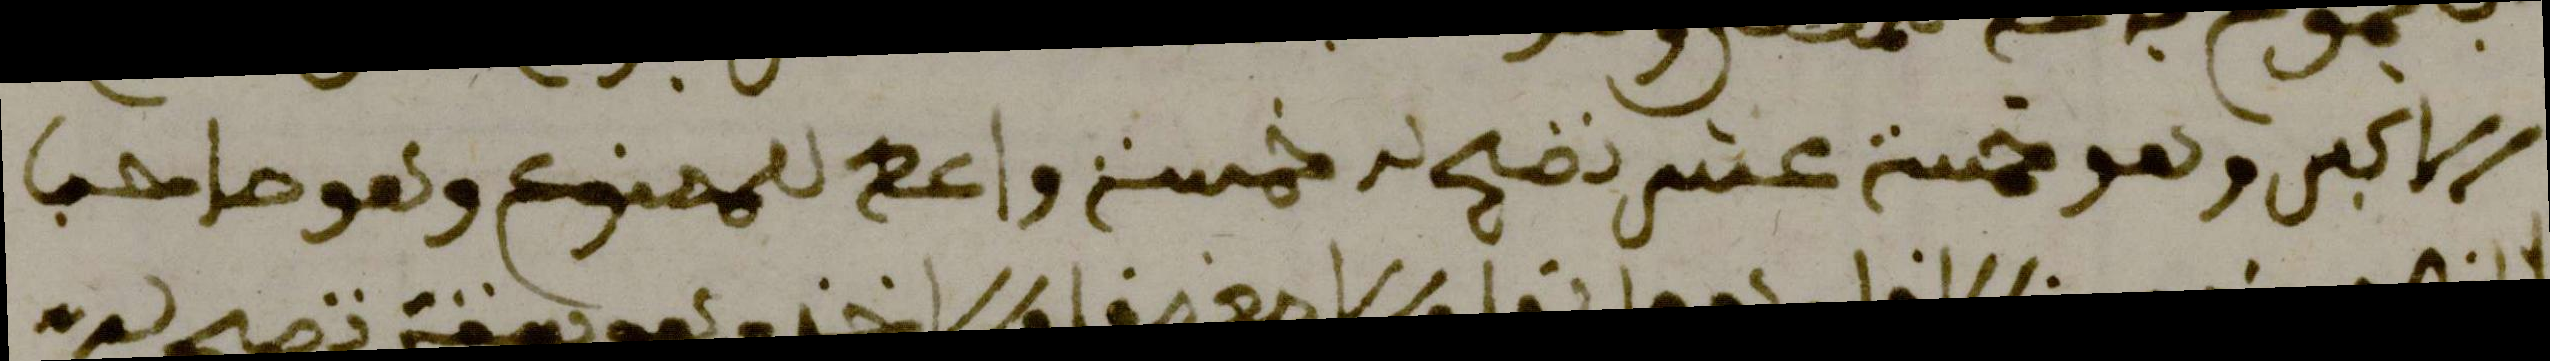الاكبر وهو خمسة عشر تصح له خمسة واعط للمجموع وهو صاحب
